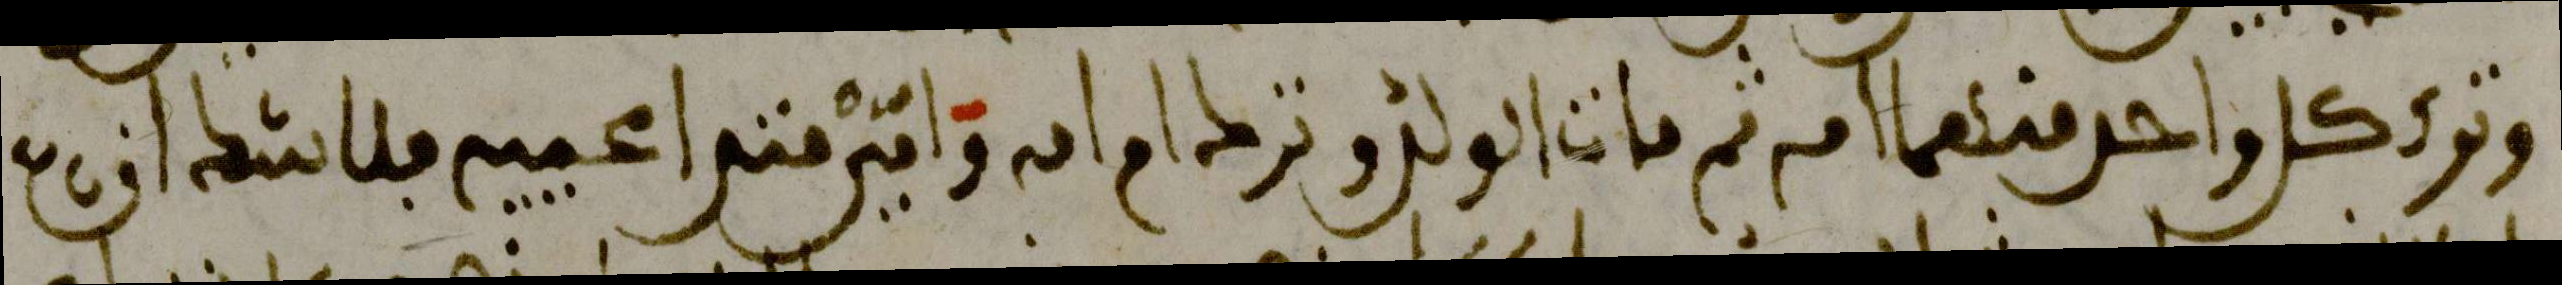وترك كل واحد منهما امه ثم مات الولد وترك ام امه وامّيْ متد اعييه فلا شك ان
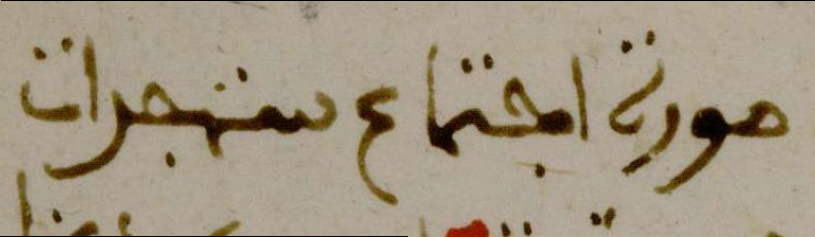صورة اجتماع ستجرات
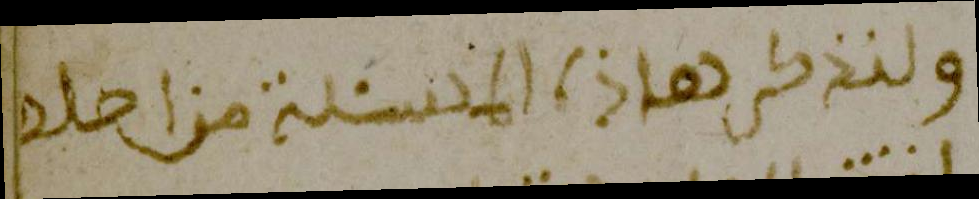ولنذكر هاذا المسئلة من اصله
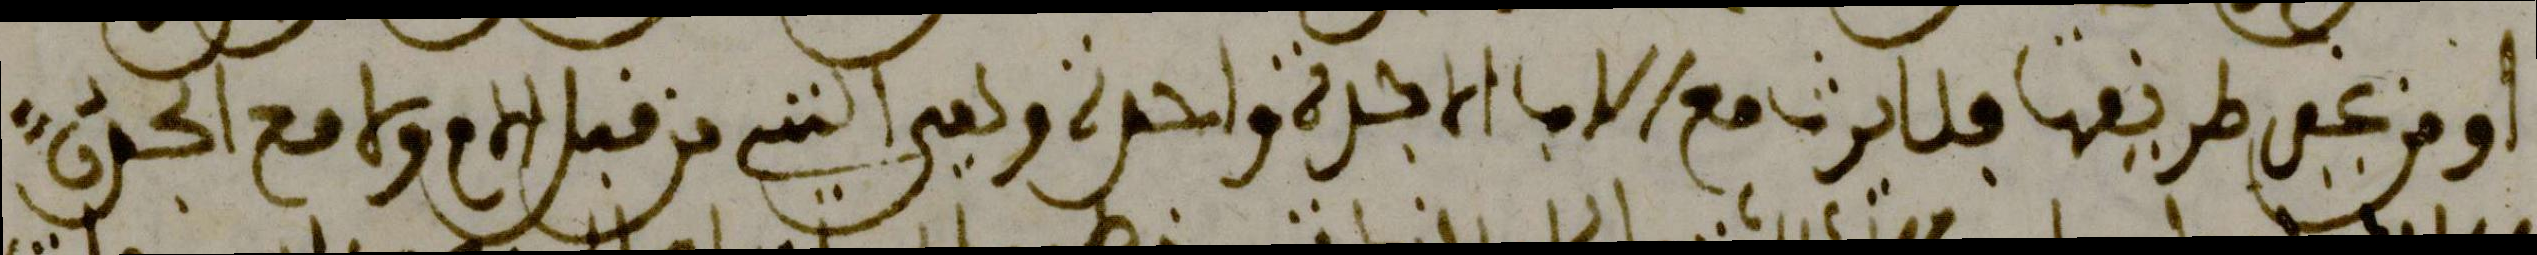او من غير طريقها فلا يرث مع الاب الاجدة واحدة وهي التي من قبل الام ولا مع الجدة
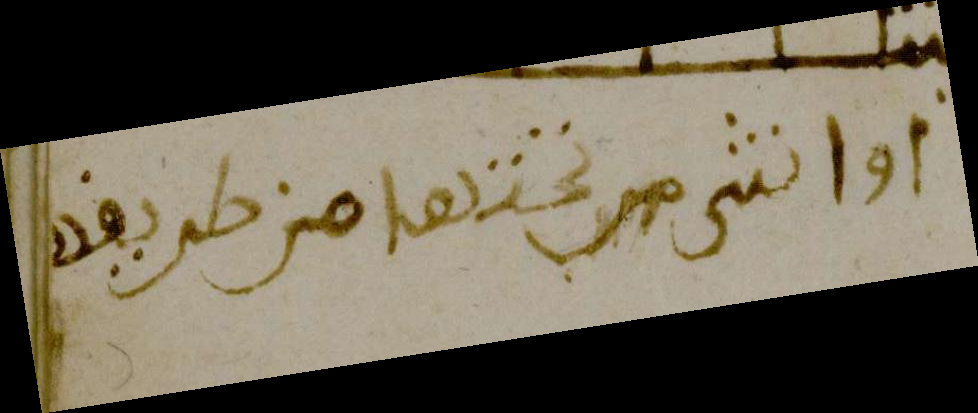او اشى من تحتها من طريقه
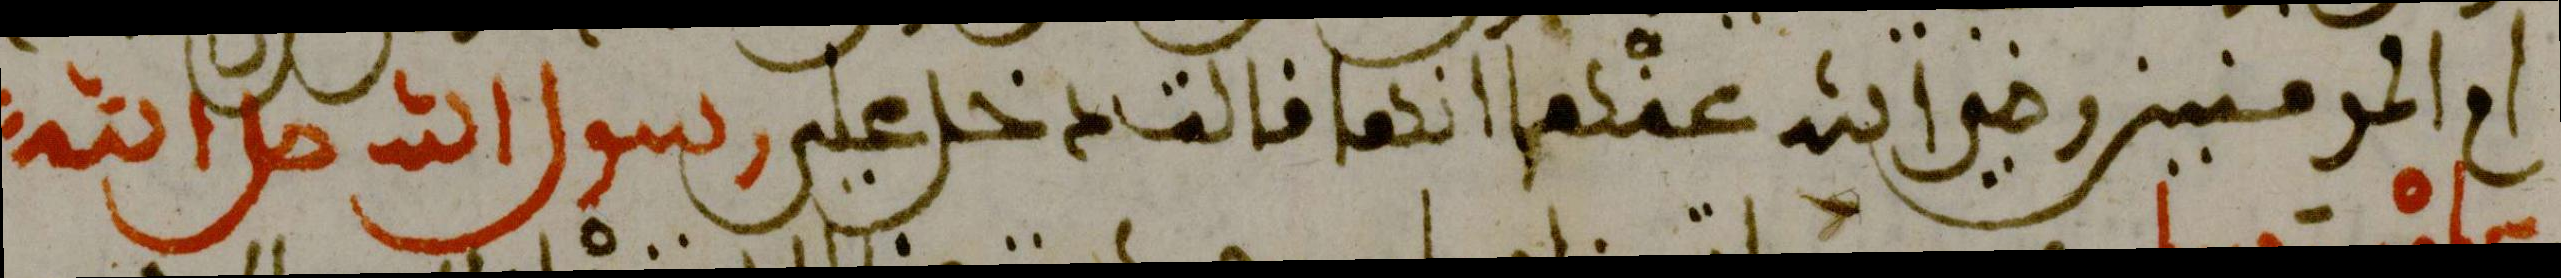ام المومنين رضي الله عنها انها قالت دخل علي رسول الله صل الله
